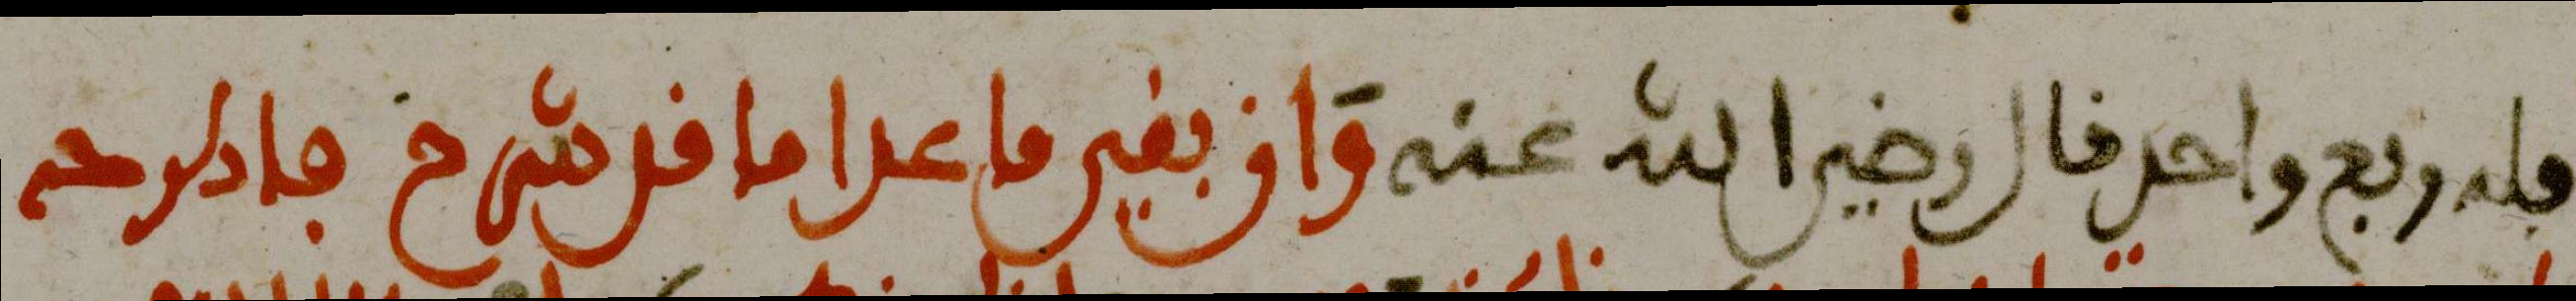فله ربع واحد قال رضي الله عنه وَان بقي ما عدا ما قد شرح فاطرح
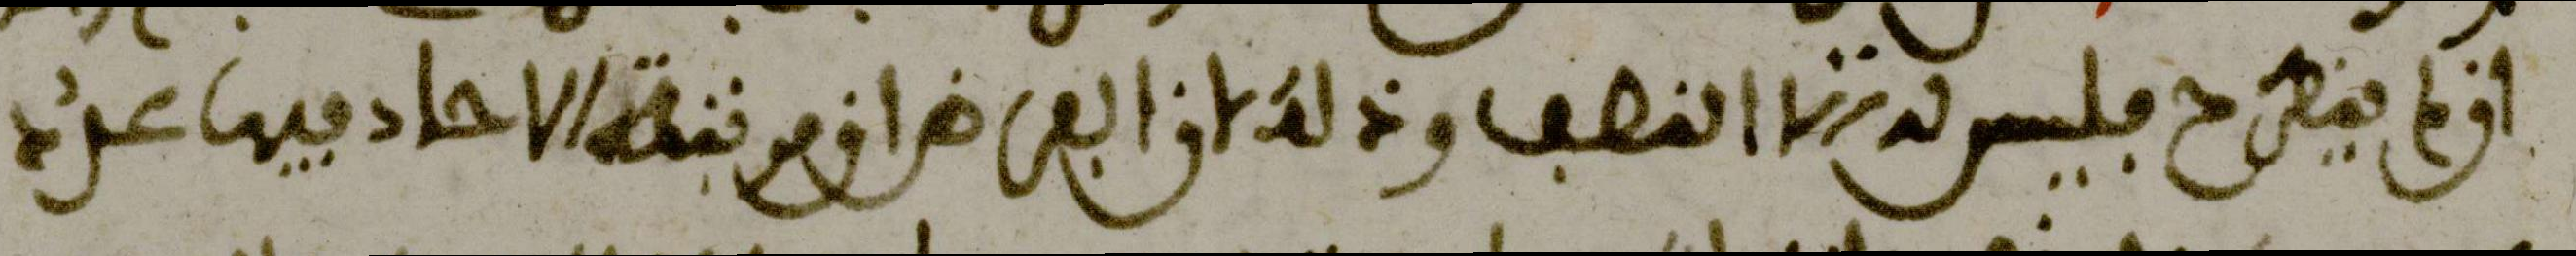ان لم ينطرح فليس له الا النصف وذلك لان الفرض ان مرتبة الاحاد فيها عدد
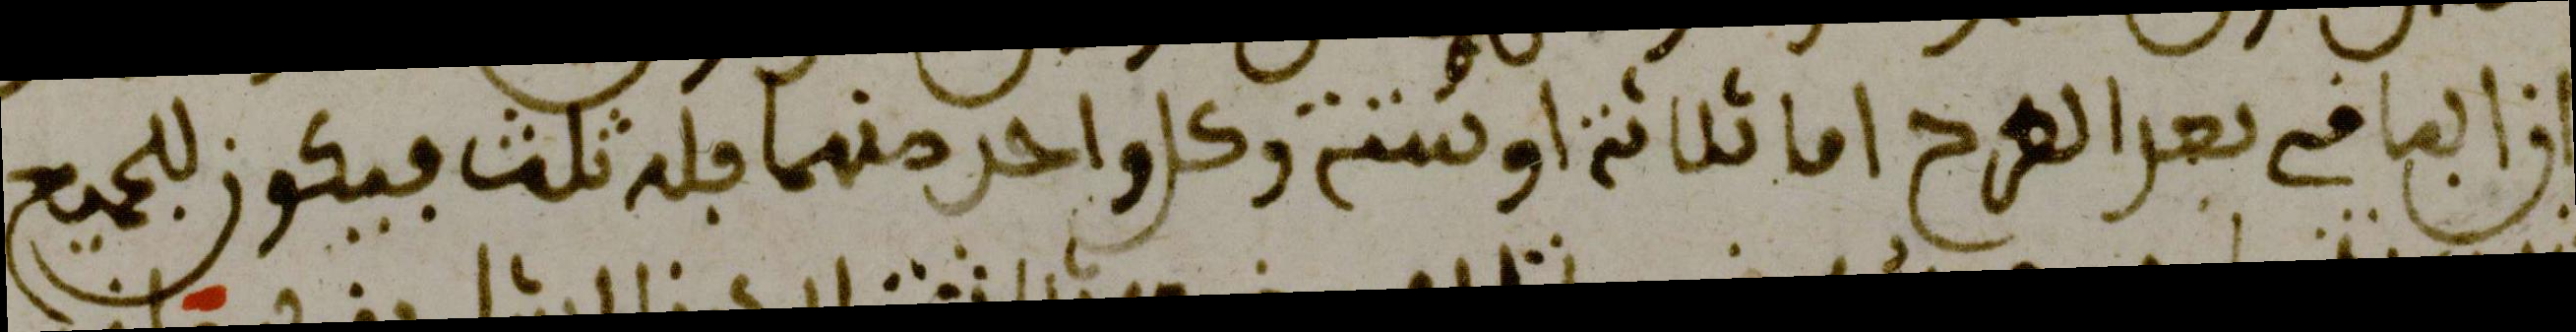ان الباقي بعد الطرح اما ثالثة او ستة وكل واحد منها فله ثلث فيكون للجميع
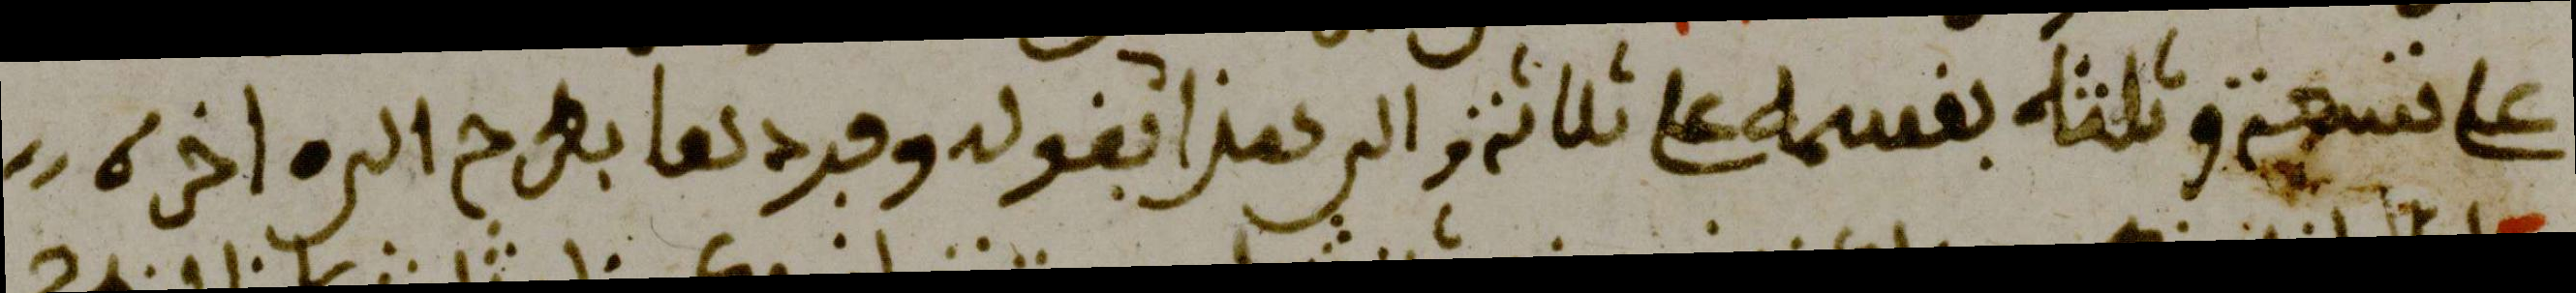على تسعة وثلثه بقسمه على ثلاثة والى هذا بقوله وفردها بطرح الى ءاخره
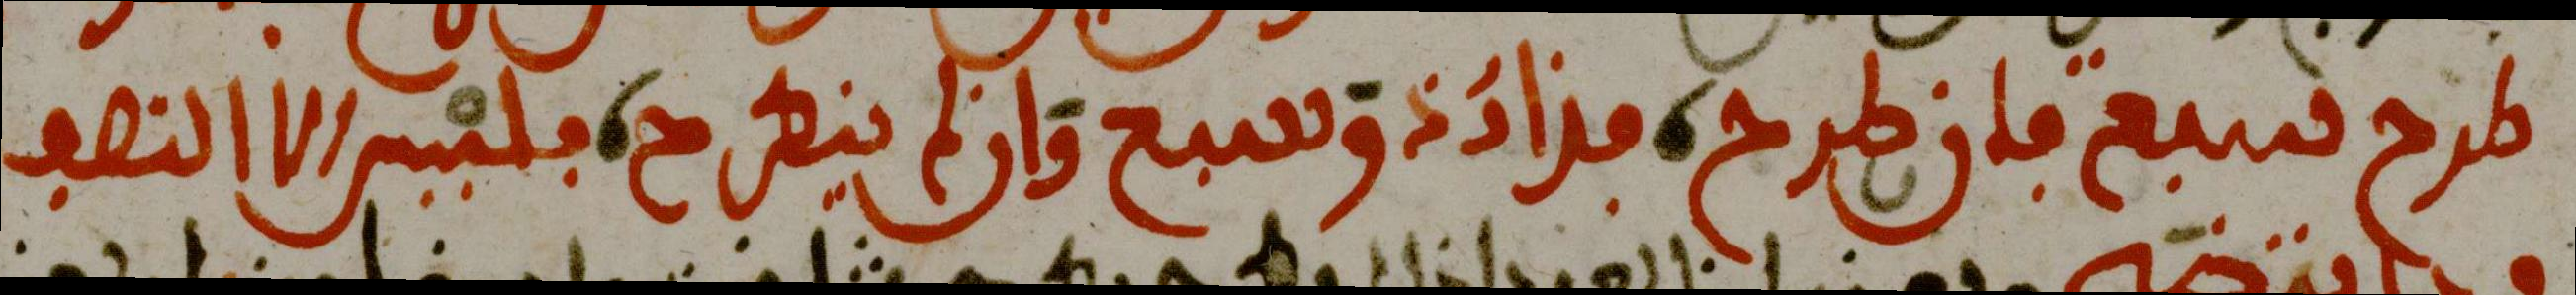طرح سبعة فان طرح فذاك ذو سبع وَان لم ينطرح فليْس الا النصف
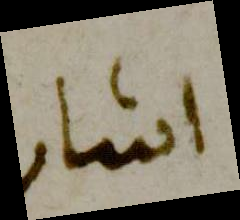اشار
